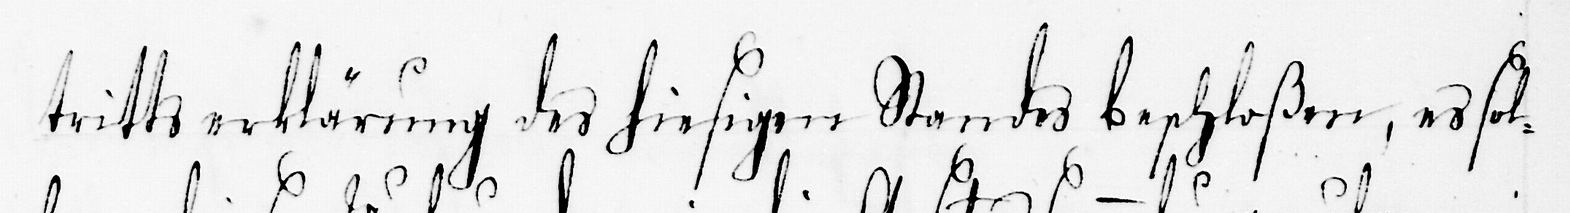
trittserklärung des hiesigen Standes beschloßen, es sol¬
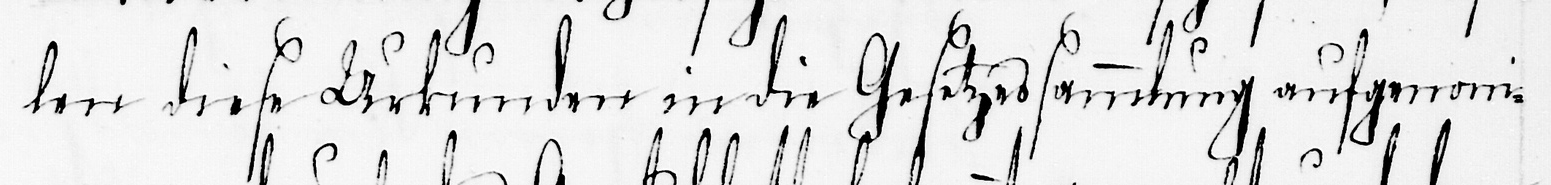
len diese Urkunden in die Gesetzessammlung aufgenom¬
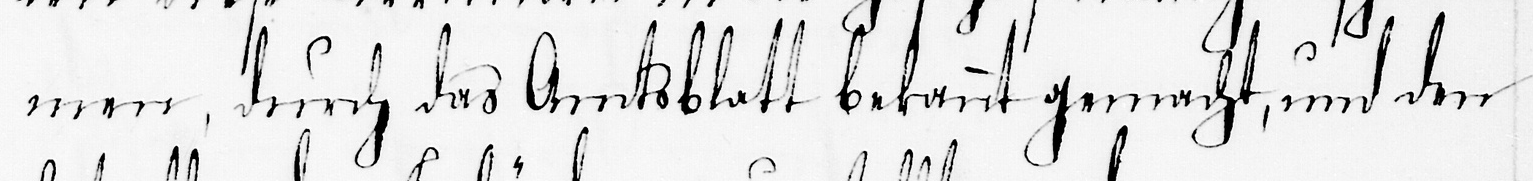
men, durch das Amtsblatt bekannt gemacht, und den
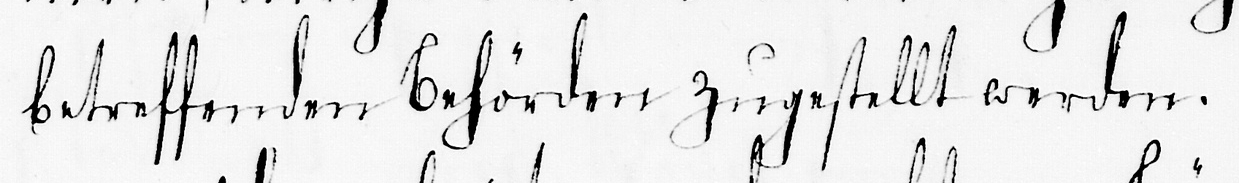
betreffenden Behörden zugestellt werden.
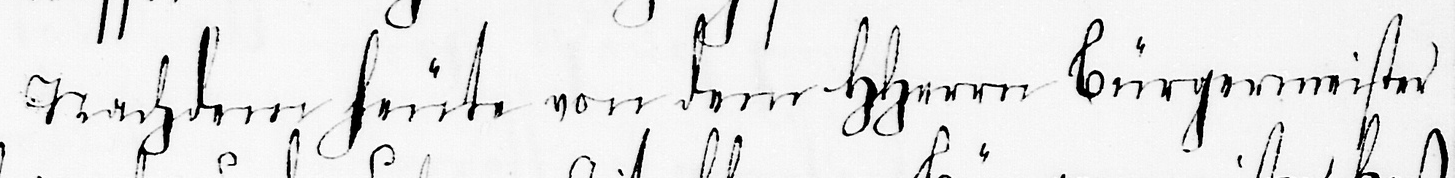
Nachdem heute von dem HHerrn Bürgermeister
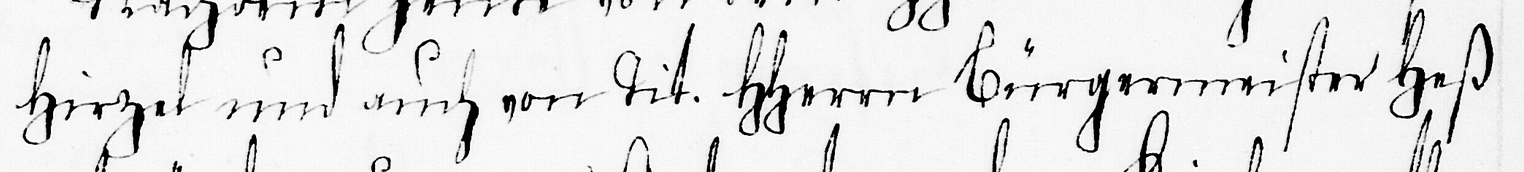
Hirzel und auch von Tit. HHerrn Bürgermeister Heß
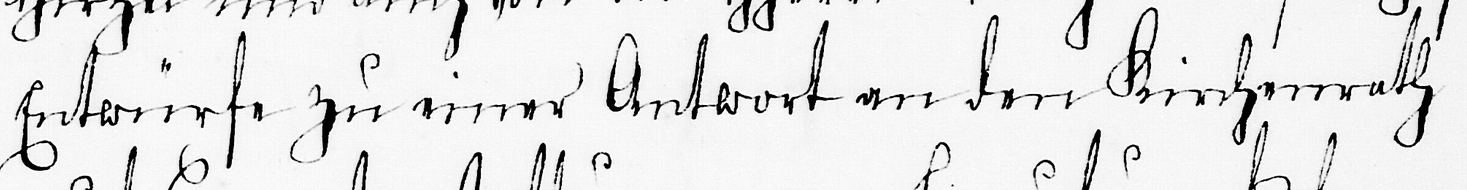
Entwürfe zu einer Antwort an den Kirchenrath
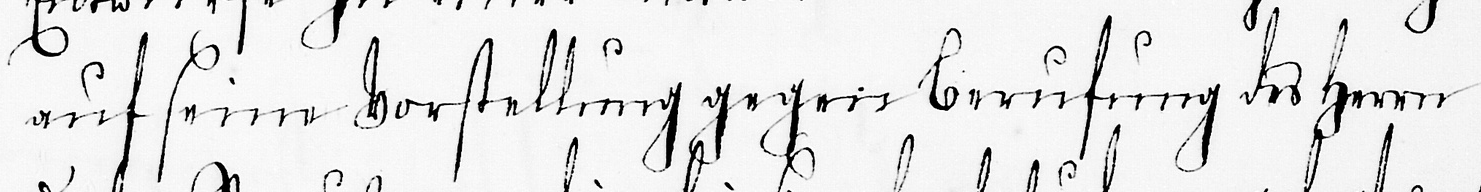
auf seine Vorstellung gegen Berufung des Herrn
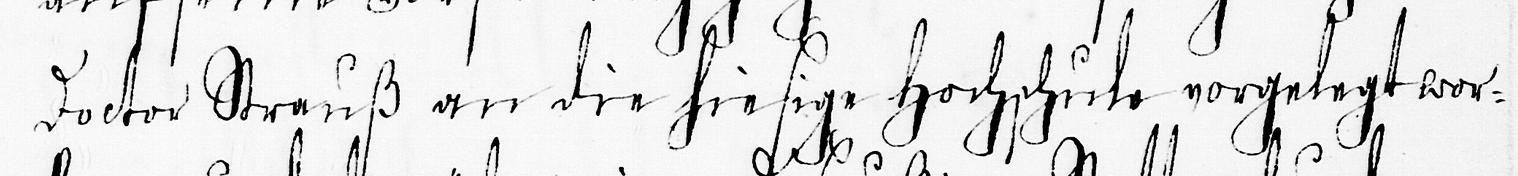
Doctor Strauß an die hiesige Hochschule vorgelegt wor¬
